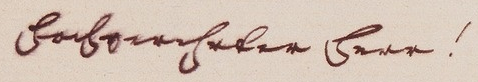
Hochverehrter Herr!
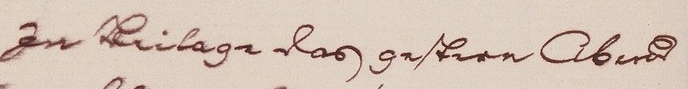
In Beilage das gestern Abend
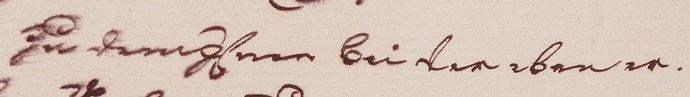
Zu dem Ihnen bei der eben er-
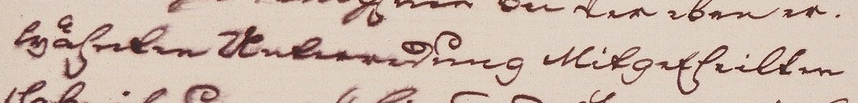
wähnten Unterredung Mitgetheilten
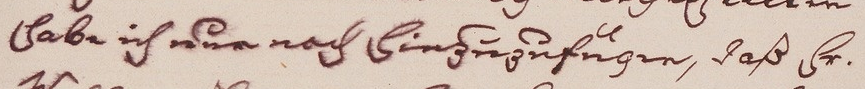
habe ich nur noch hinzuzufügen, daß Hr.
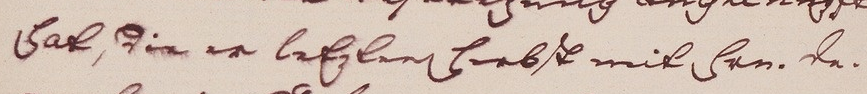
hat, die er letzten Herbst mit Hrn. De-
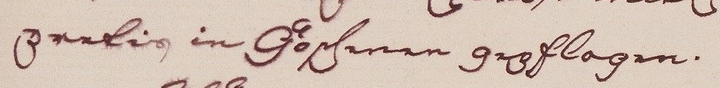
pretis in Göschenen gepflogen.
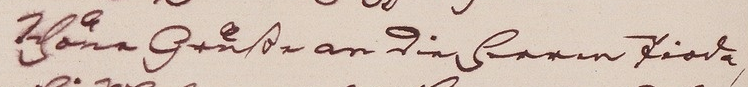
Schöne Grüße an die Herren Pioda,
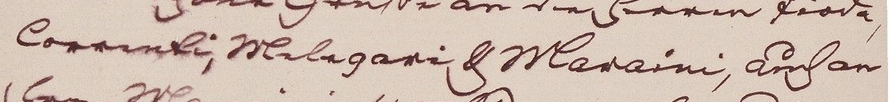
Correnti, Melegari & Maraini, auch an
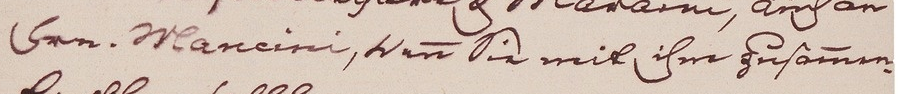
Hrn. Mancini, wenn Sie mit ihm zusammen-
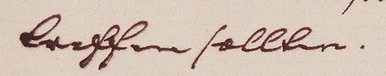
treffen sollten.
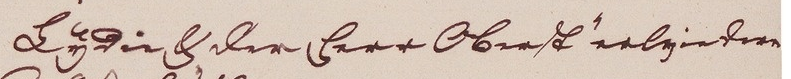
Lydie & «der Herr Oberst» erwiedern
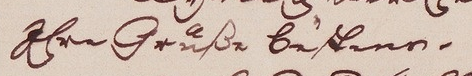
Ihre Grüße bestens.
